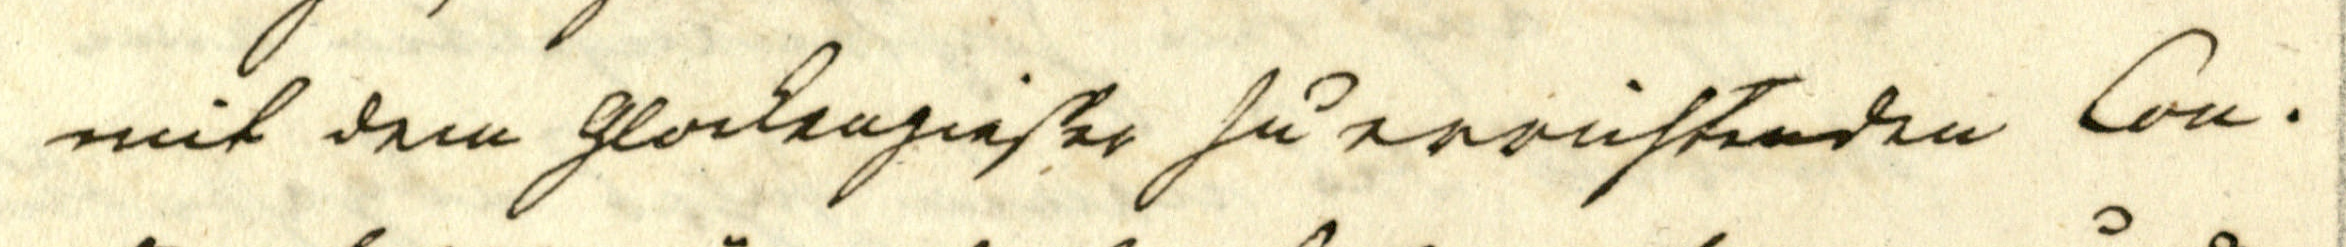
mit dem Gockengiesser zu errichtenden Con¬
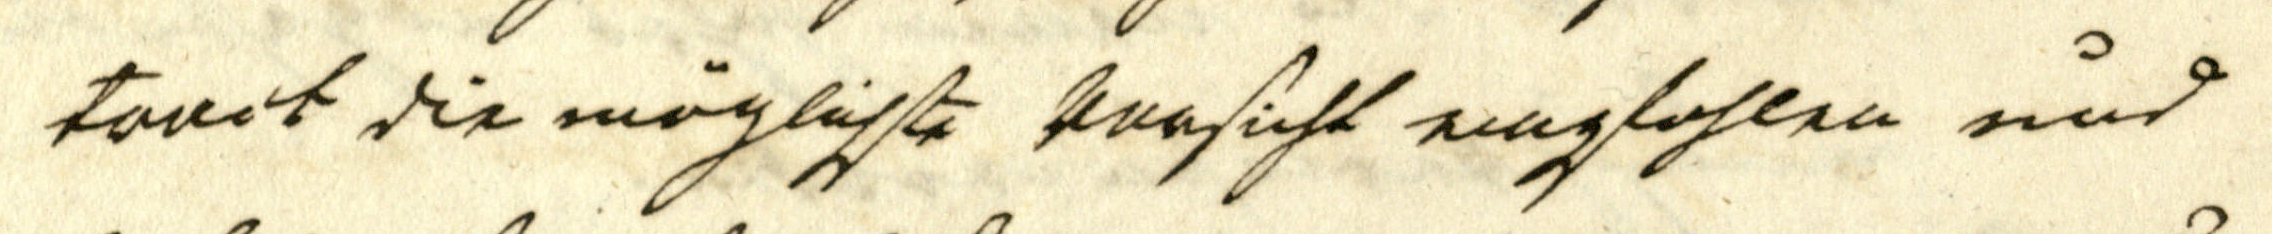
tract die möglichste Vorsicht empfohlen und
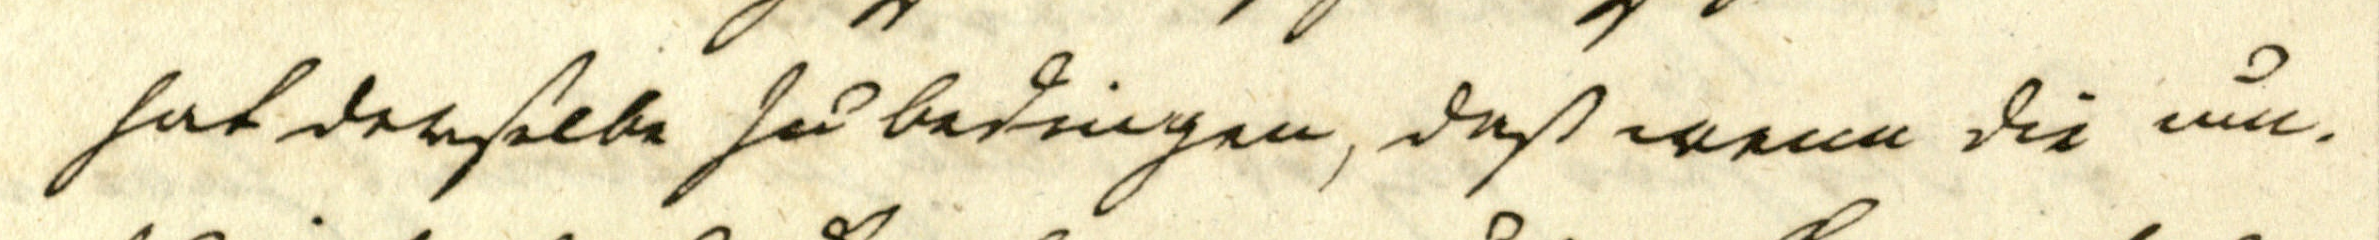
hat derselbe zu bedingen, daß wenn die um¬
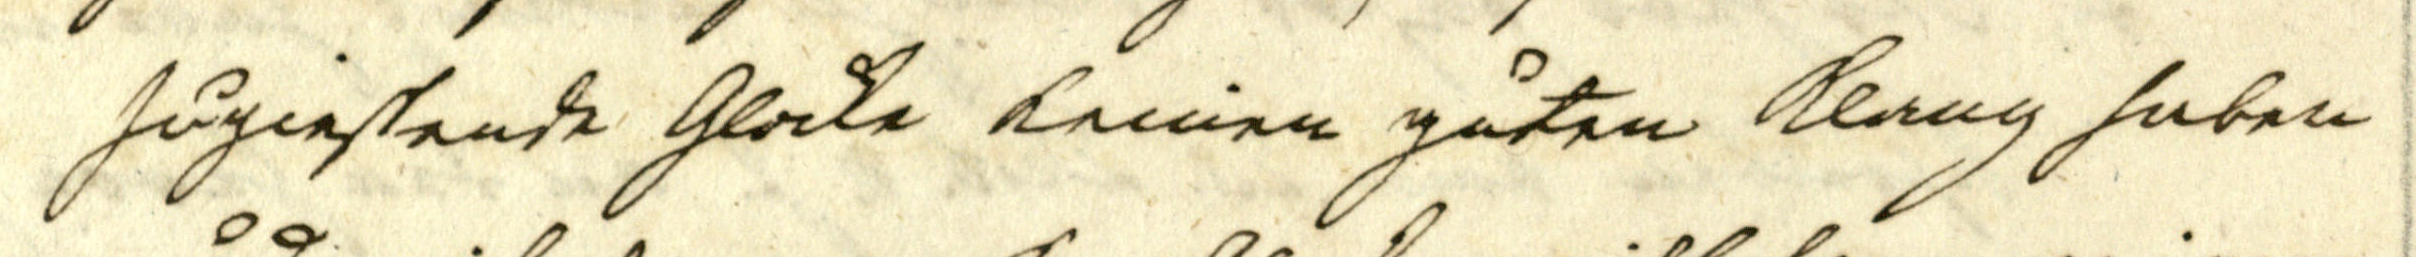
zugiessende Glocke keinen guten Klang haben
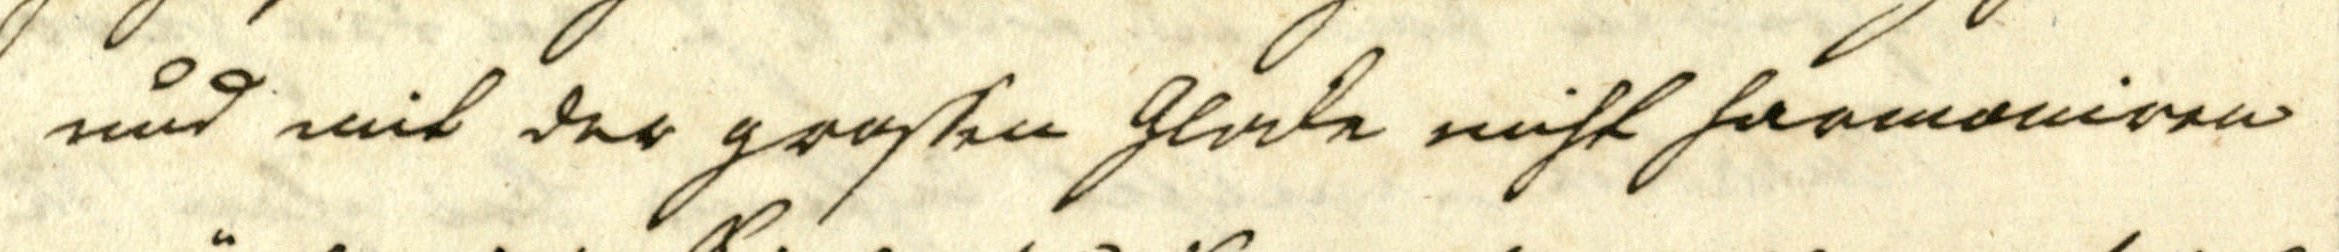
und mit der grossen Glocke nicht harmoniren
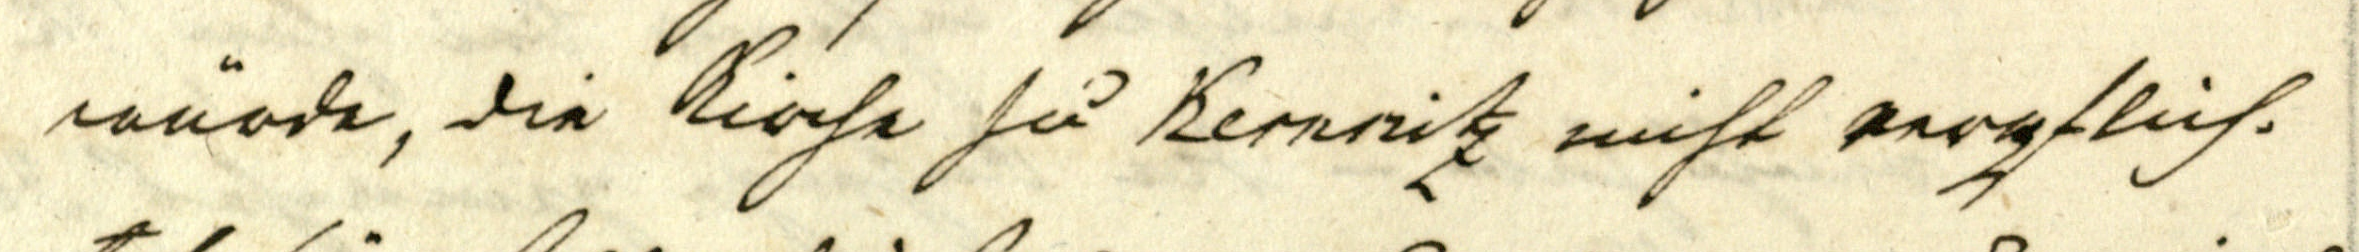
würde, die Kirche zu Kemnitz nicht verpflich¬
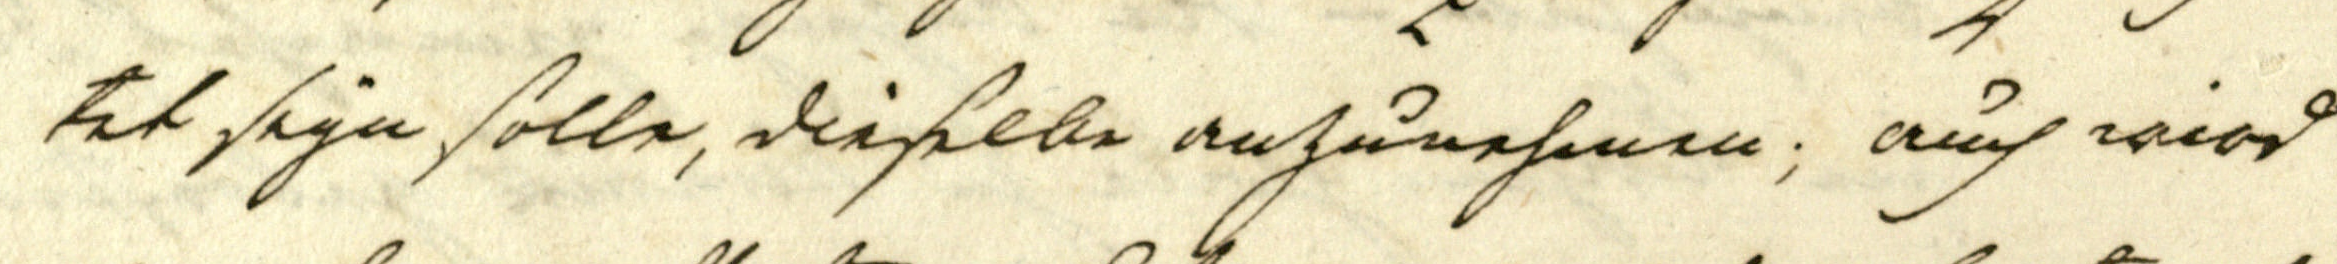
let seÿn solle, dieselbe anzunehmen; auch wird
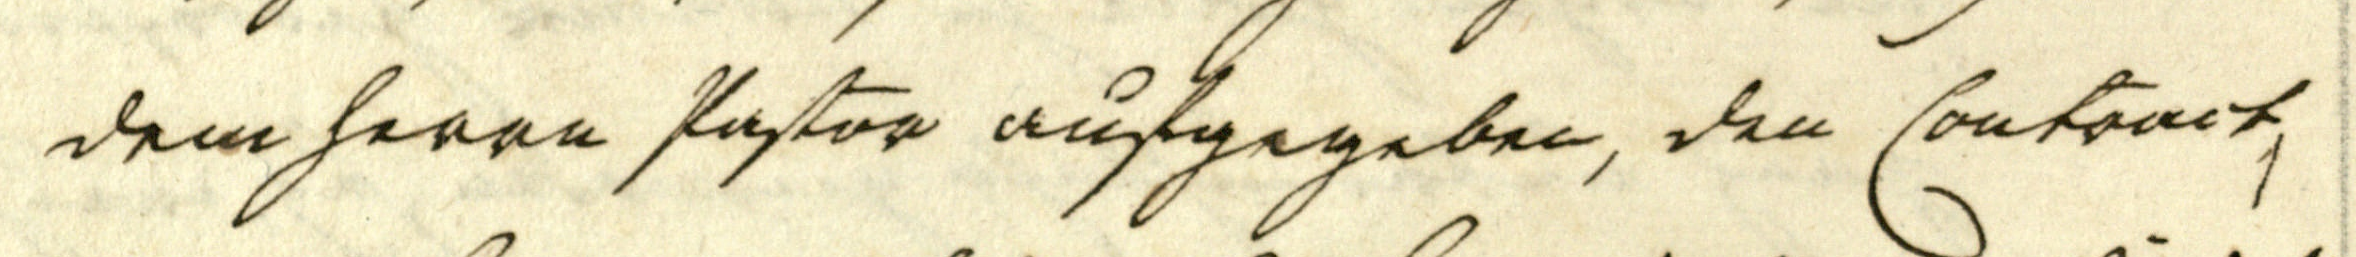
dem Herrn Pastor aufgegeben, den Contract
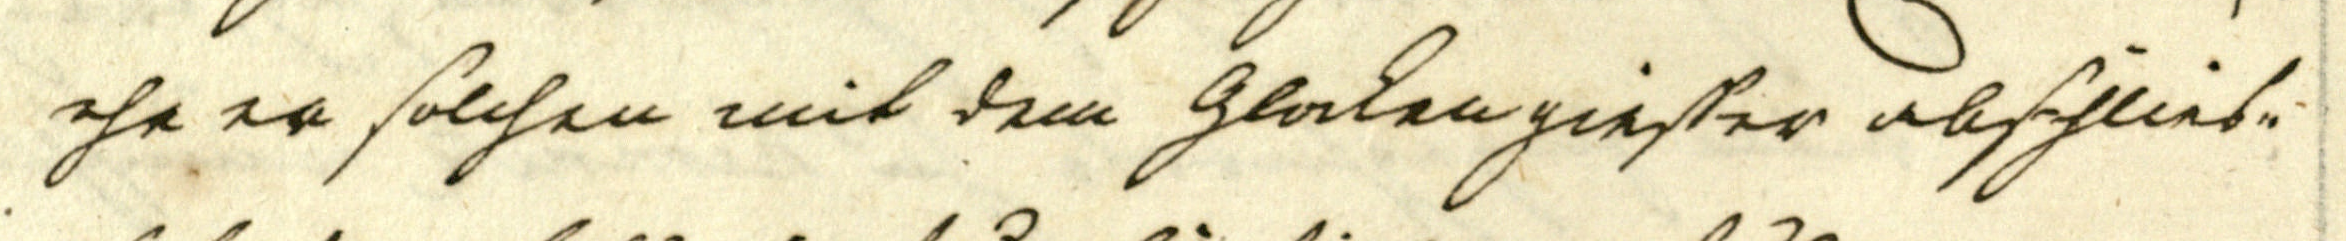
ehe er solchen mit dem Glockengiesser abschlies¬
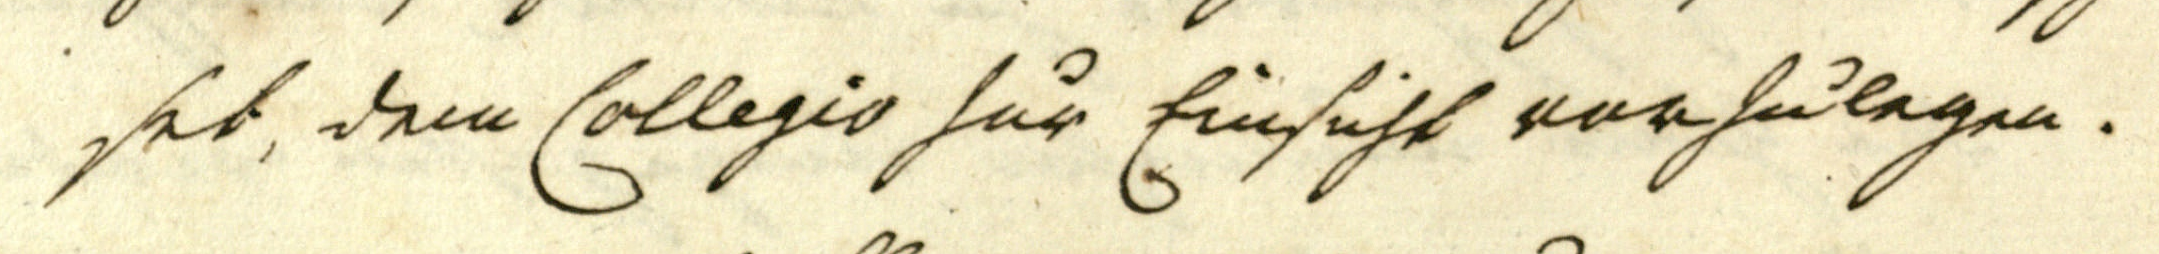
set, dem Collegio zur Einsicht vorzulegen.
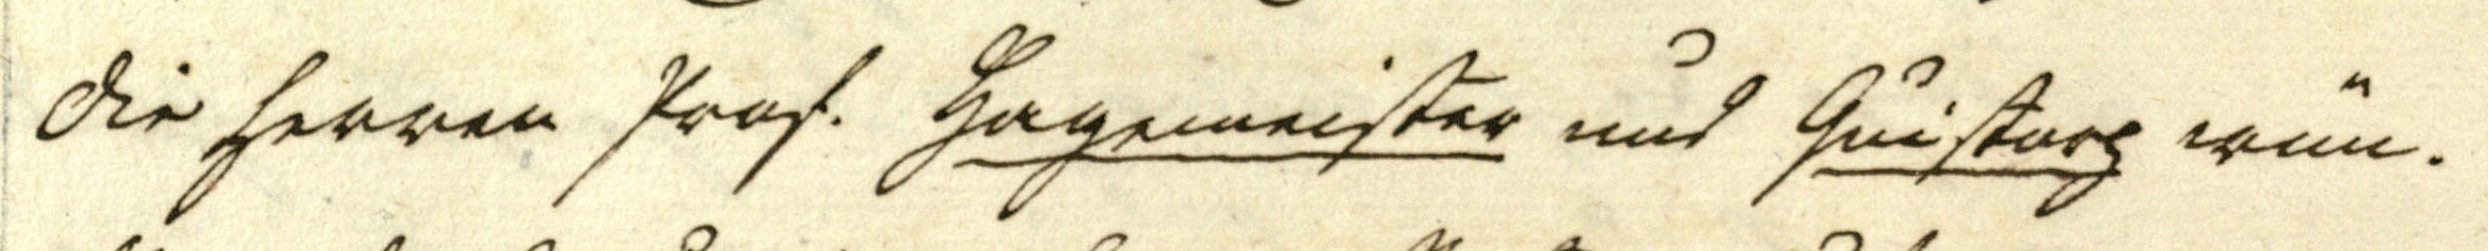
Die Herren Prof. Hagemeister und Quistorp wün¬
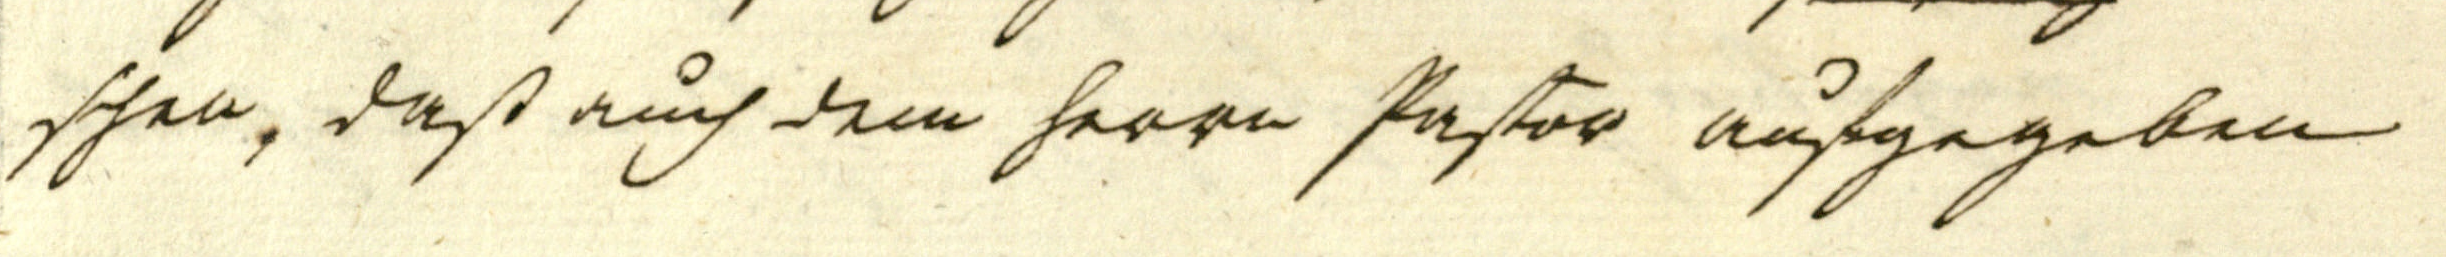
schen, daß auch dem Herrn Pastor aufgegeben
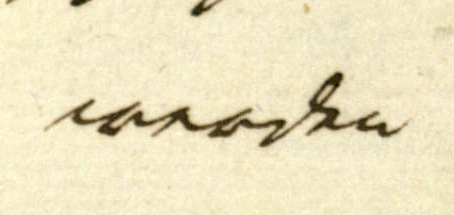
werden
